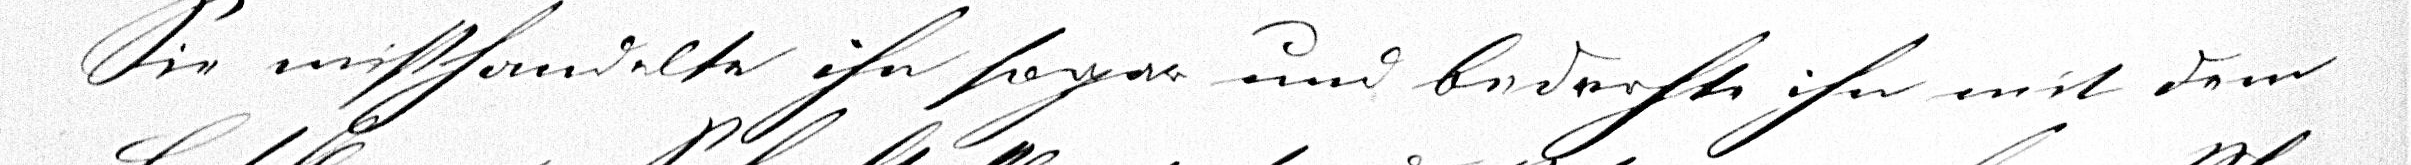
Sie mißhandelte ihn sogar und bedrohte ihn mit dem
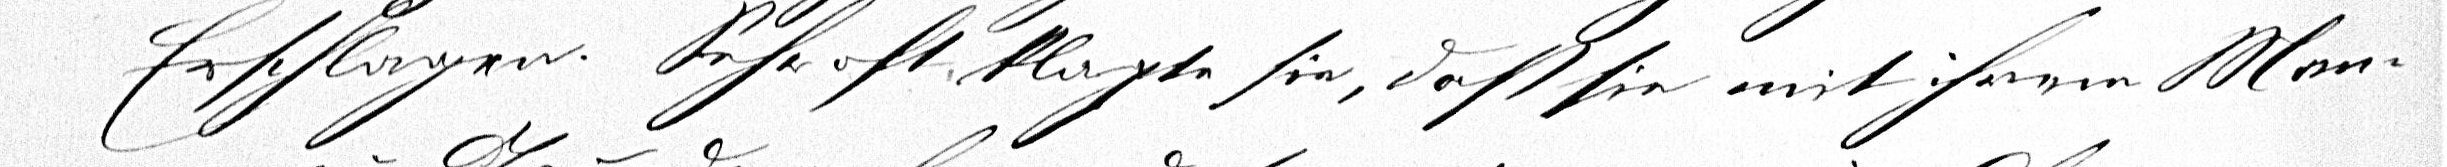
Erschlagen. Sehr oft klagte sie, daß sie mit ihrem Man¬
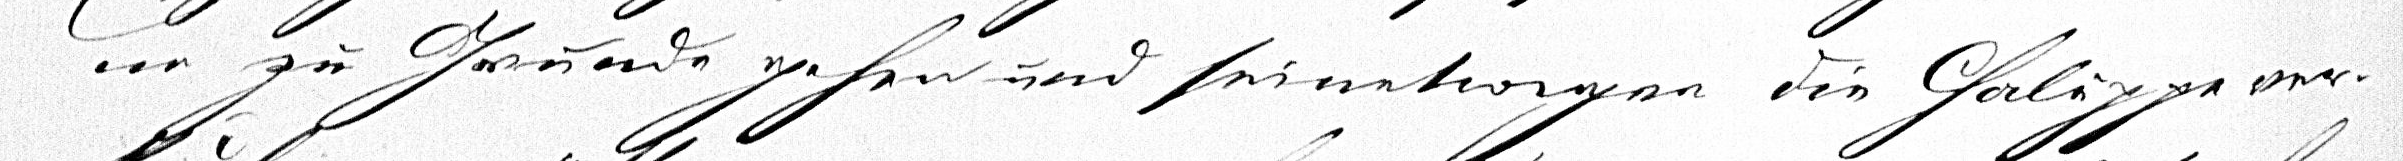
ne zu Grunde gehen und seinetwegen die Galöppe ver¬
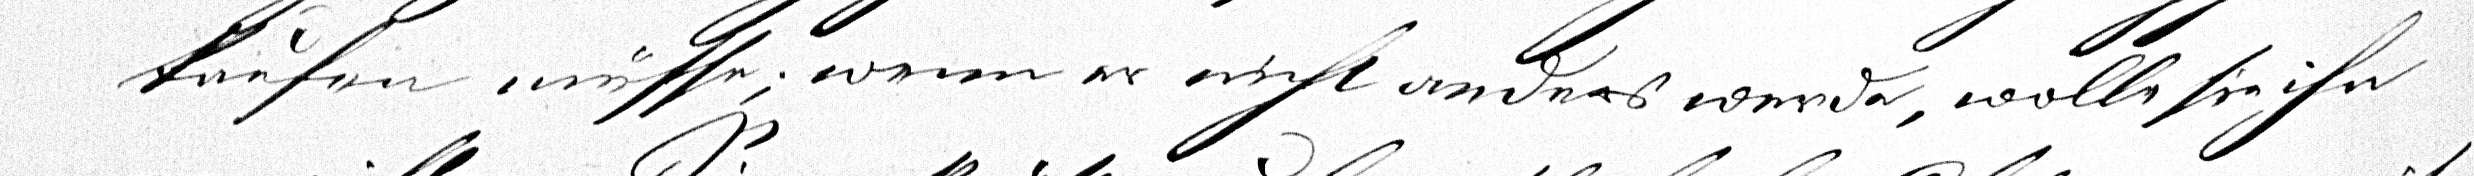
kaufen müsse; wenn er nicht anders werde, wolle sie ihn
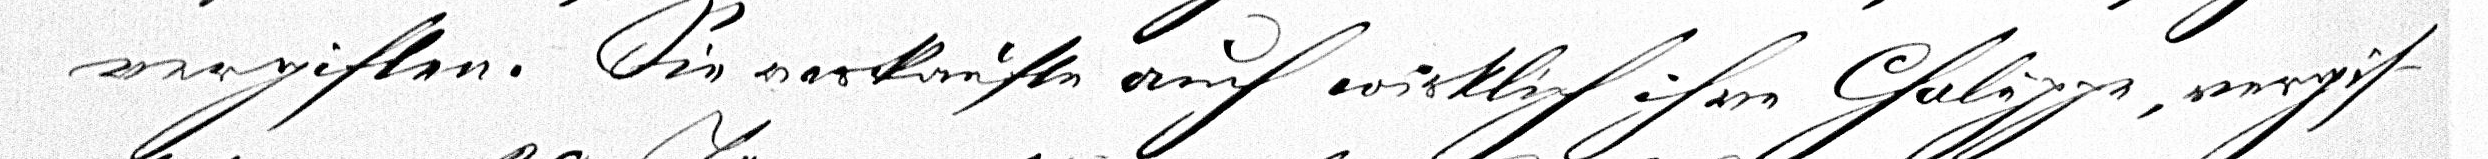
vergiften. Sie verkaufte auch wirklich ihre Galöppe, vergif¬
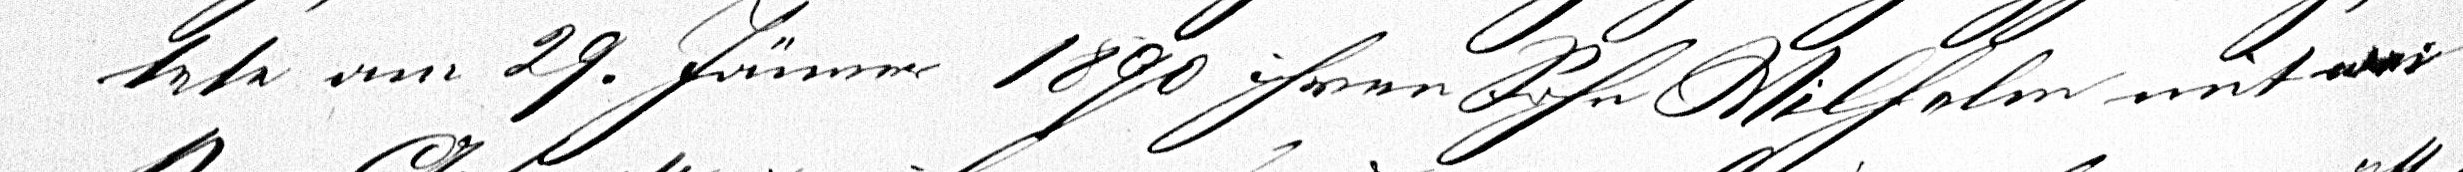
tete am 29. Jänner 1890 ihrer Sohn Wilhelm mit xx¬
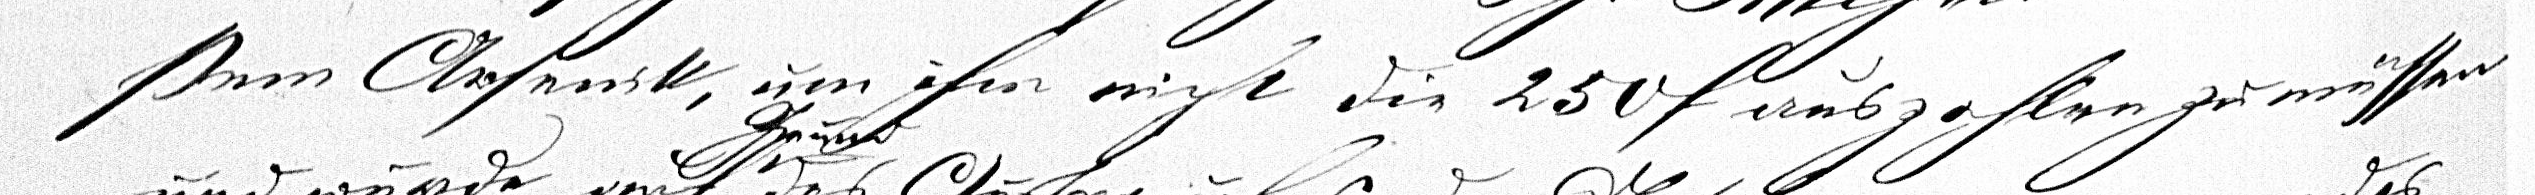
ßem Arsenik, um ihm nicht die 250f aus zahlen zu müssen
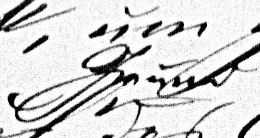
Grund
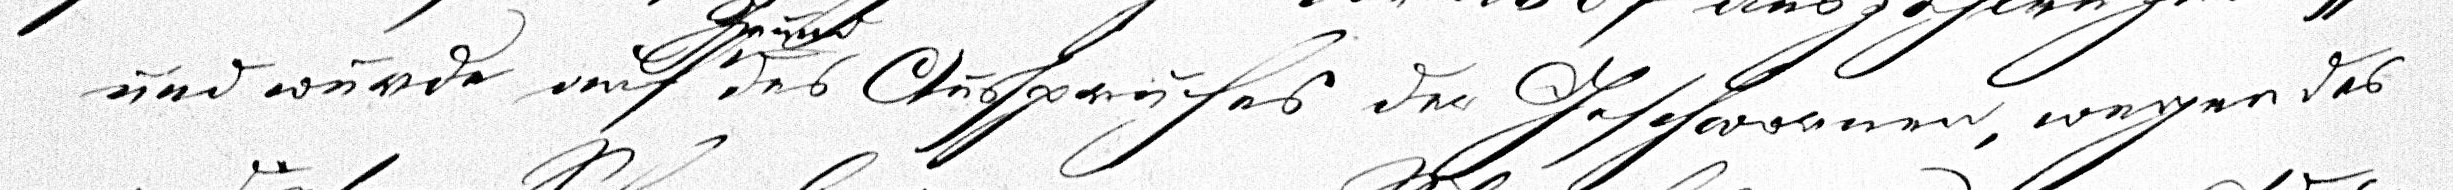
und wurde auf des Ausspruches der Geschwornen, wegen des
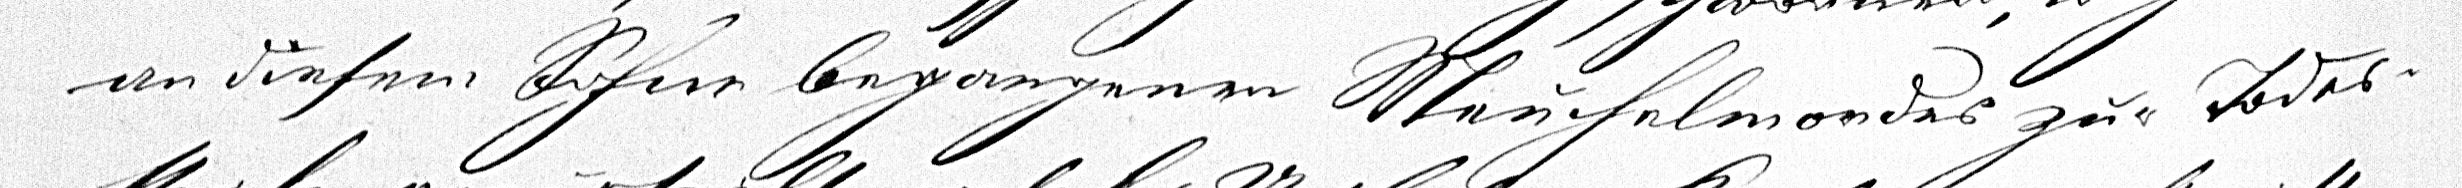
an diesem, Sohne begangenen Meuchelmordes zur Todes¬
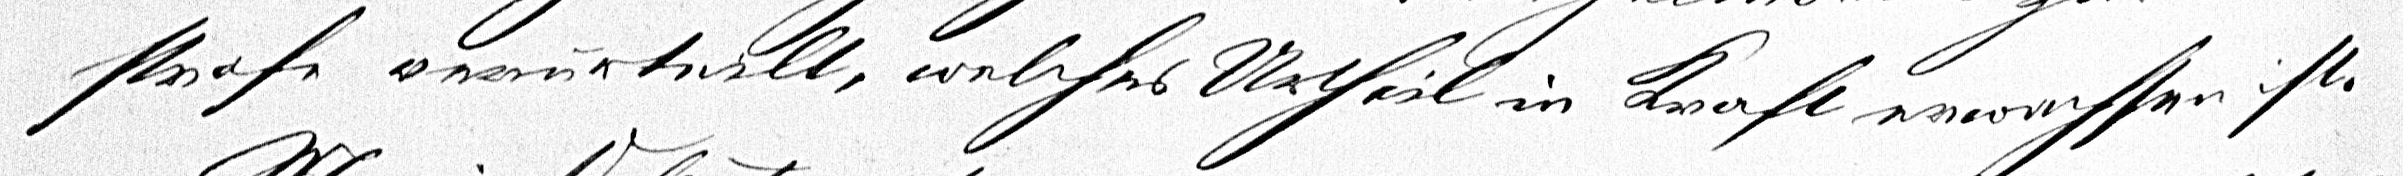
strafe verurteilt, welches Urtheil in Kraft erwachter ist.
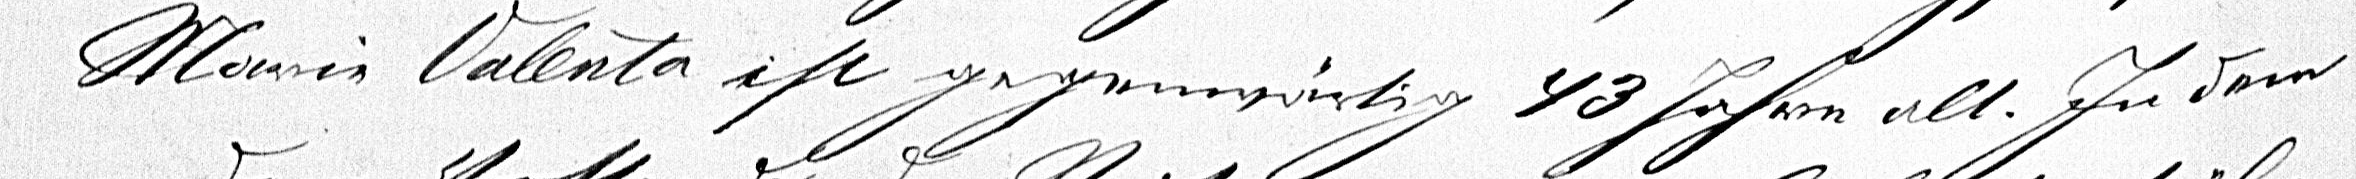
Marie Valenta ist gegenwärtig 43 Jahre alt. In dem
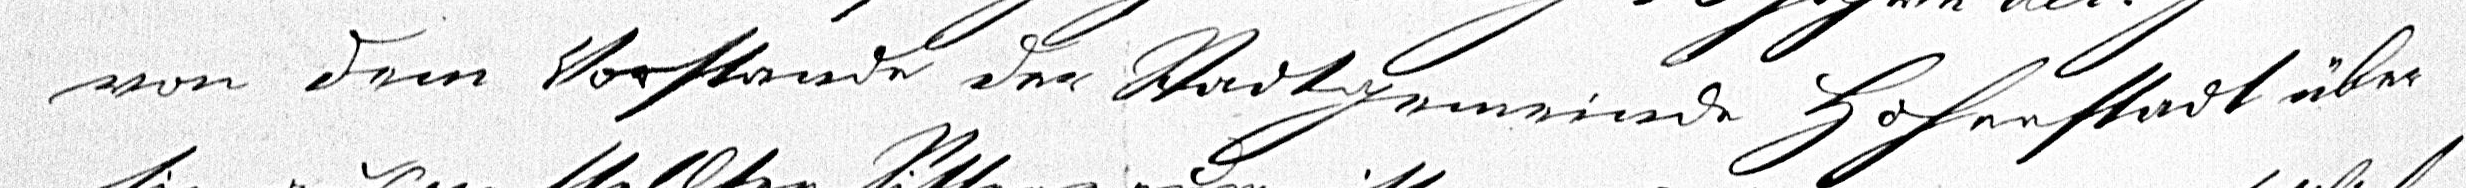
von dem Vorstande der Stadtgemeinde Hoferstadt über
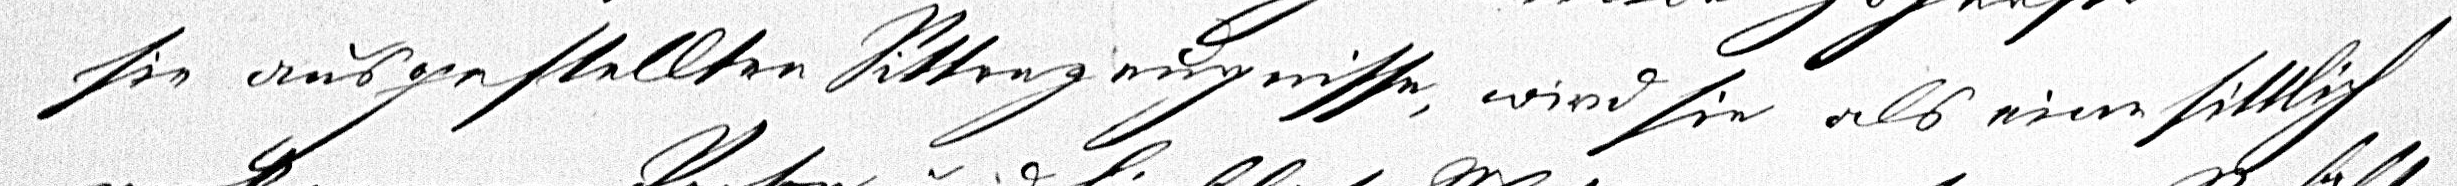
sie aus gestellter Sittenzeugnisse, wird sie als eine sittlich
